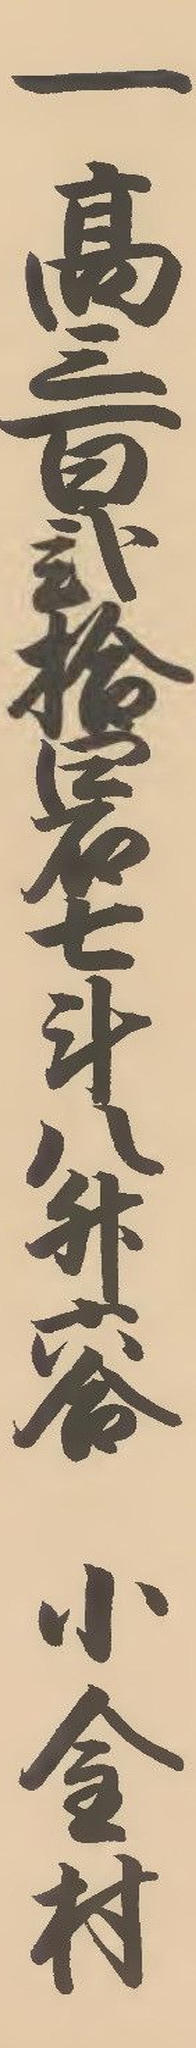一髙三百弐拾四石七斗八升六合小金村
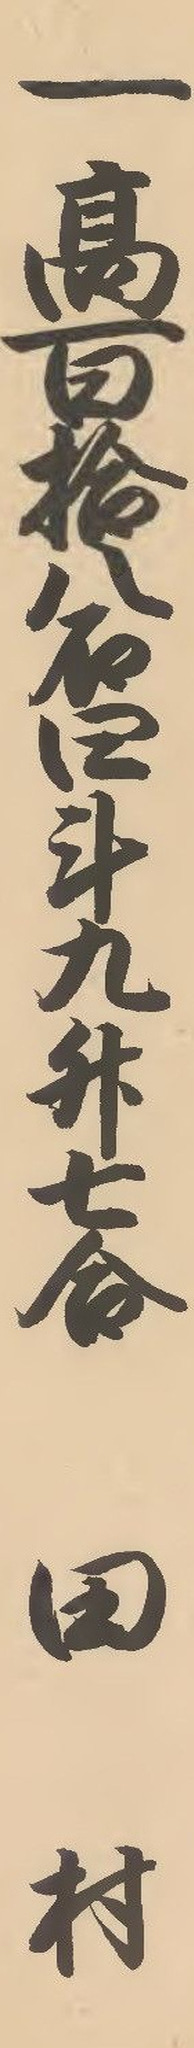一髙百拾八石四斗九升七合田村

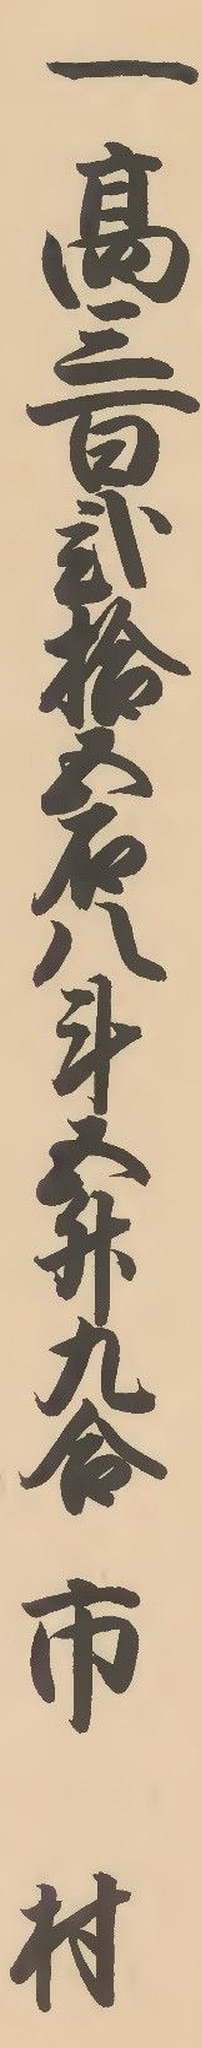一髙三百弐拾五石八斗五升九合市村
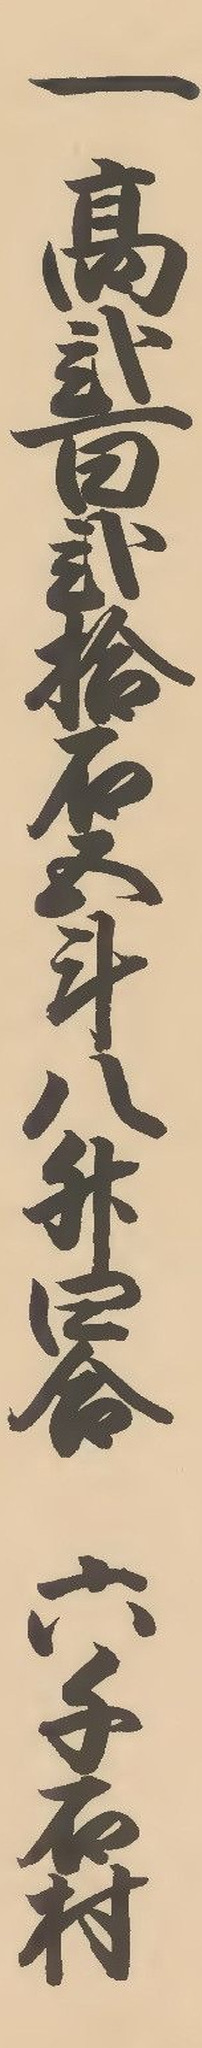一髙弐百弐拾石五斗八升四合六千石村
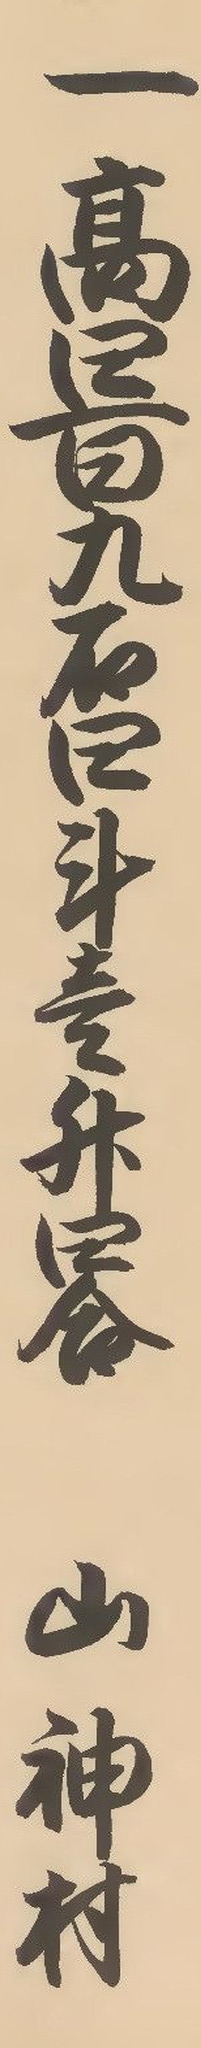一髙四百九石四斗壱升四合山神村
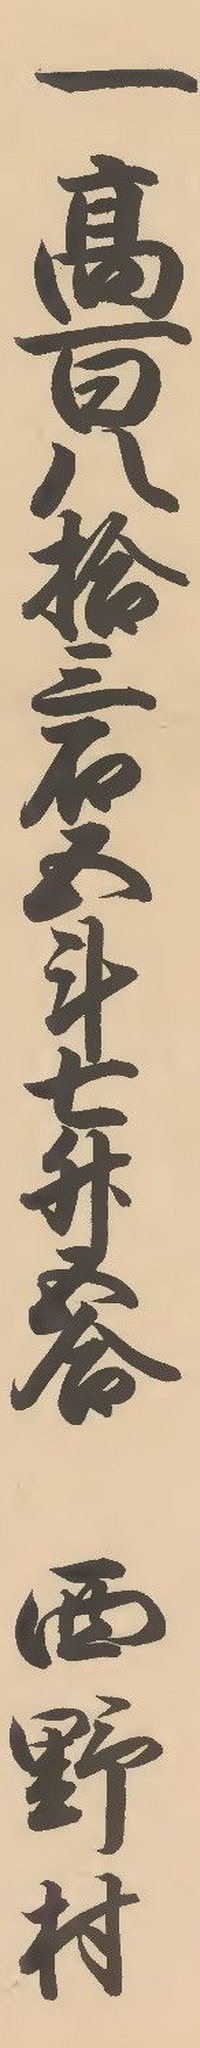一髙百八拾三石五斗七升五合西野村
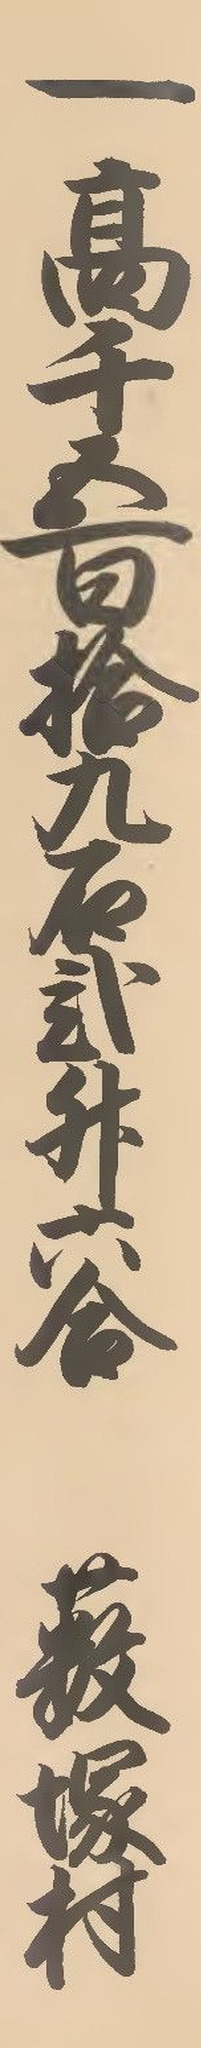一髙千五百拾九石弐升六合藪塚村
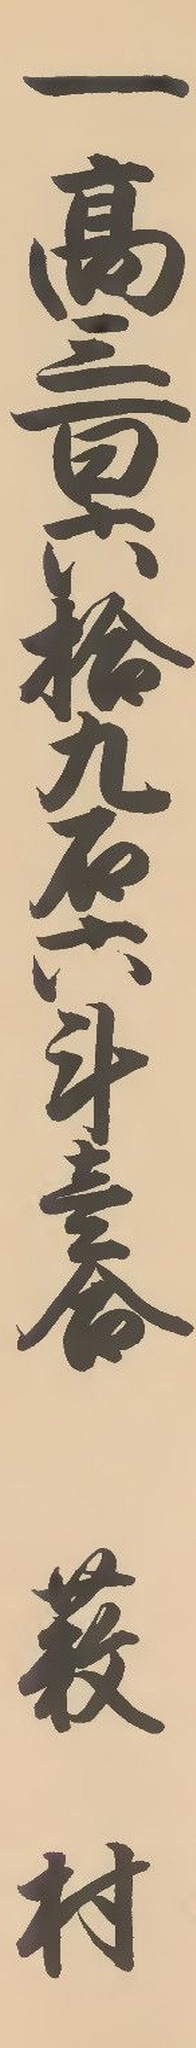一髙三百六拾九石六斗壱合藪村
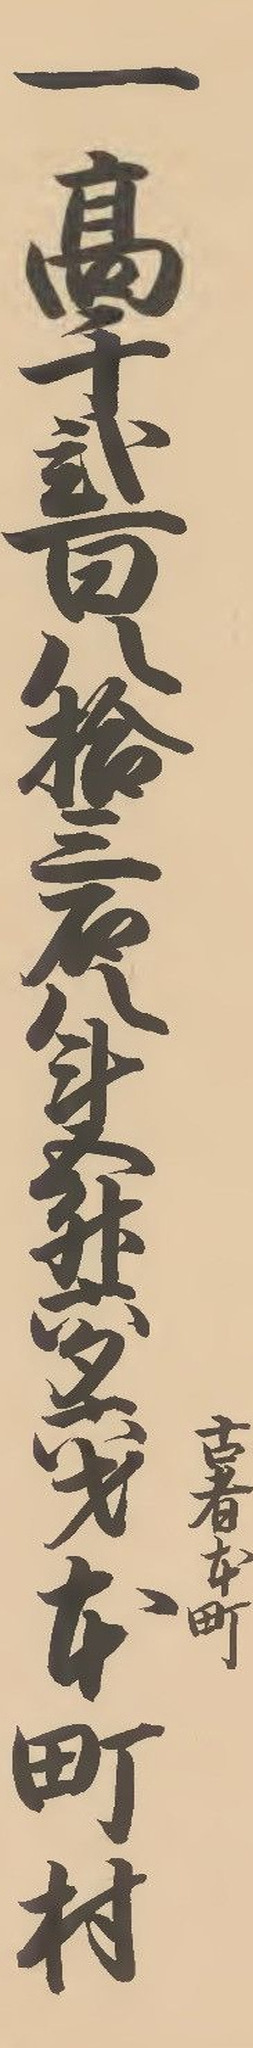一髙千弐百八拾三石八斗五升六夕六才本町村
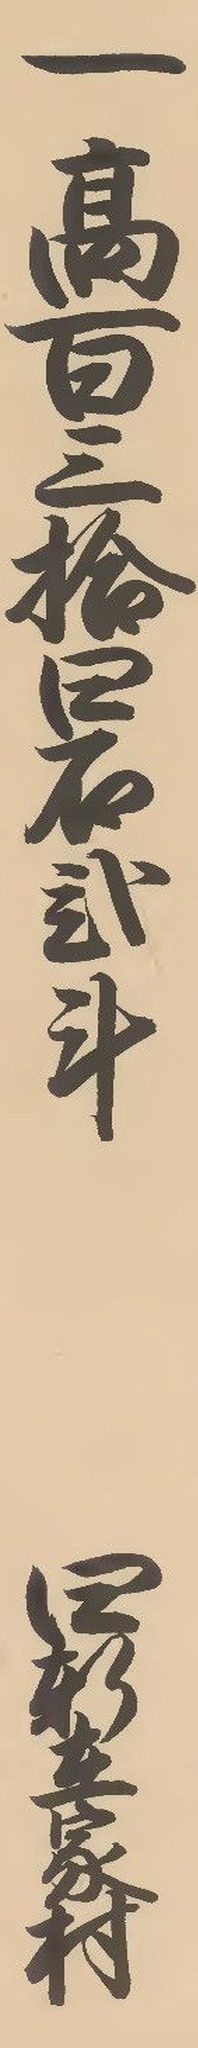一髙百三拾四石弐斗四軒在家村

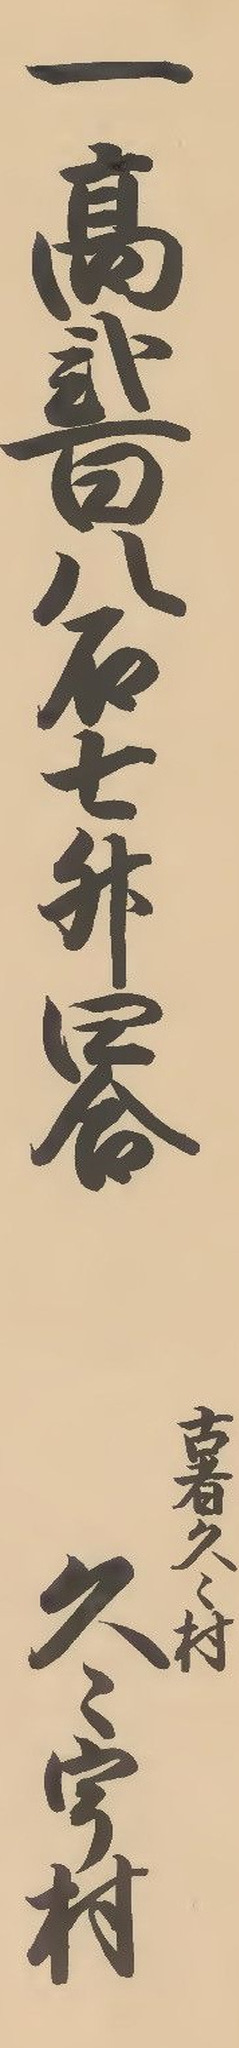一髙弐百八石七升四合久々宇村
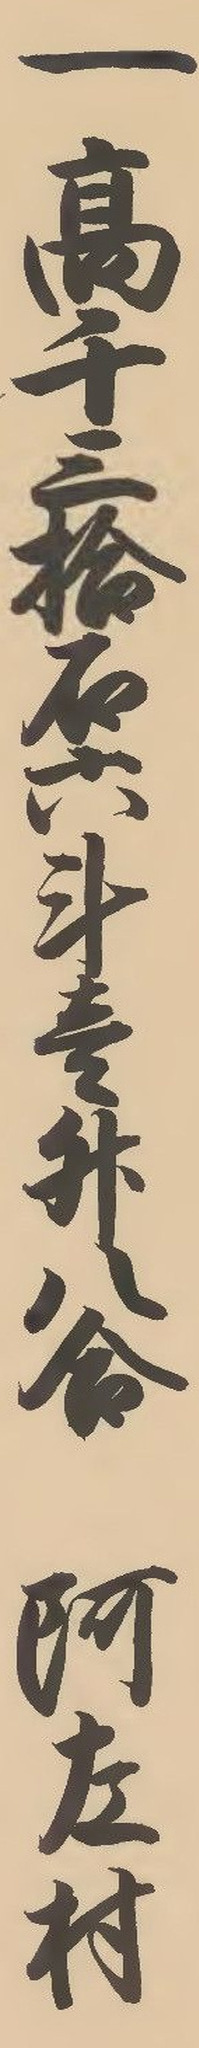一髙千三拾石六斗壱升八合阿左村
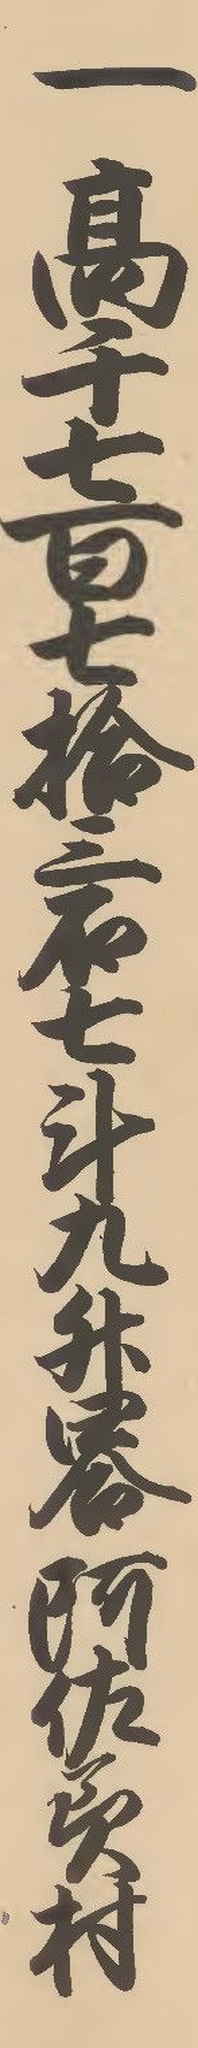一髙千七百七拾三石七斗九升四合阿佐美村
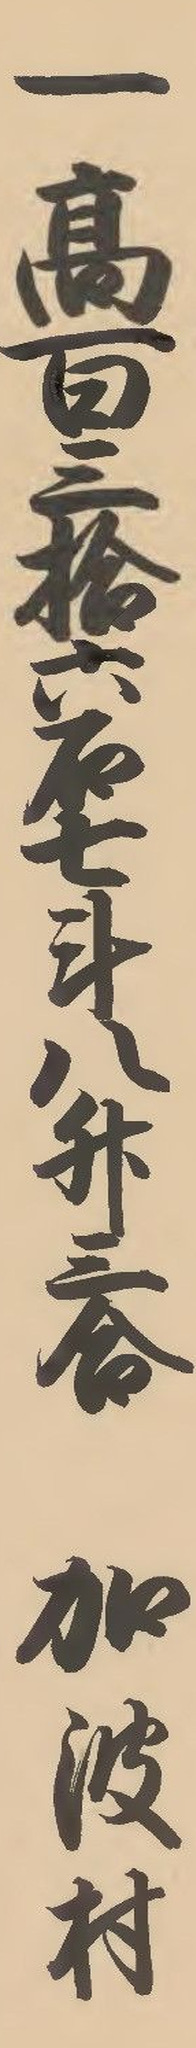一髙百三拾六石七斗八升三合加波村
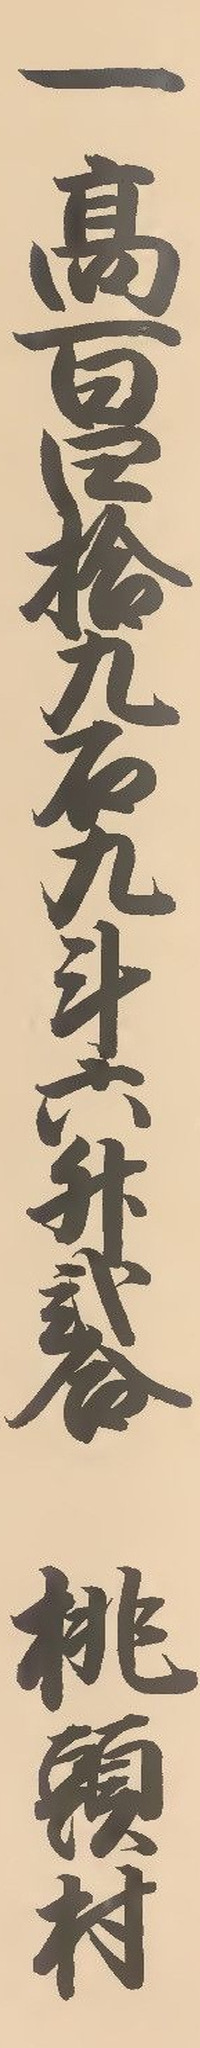一髙百四拾九石九斗六升弐合桃頭村
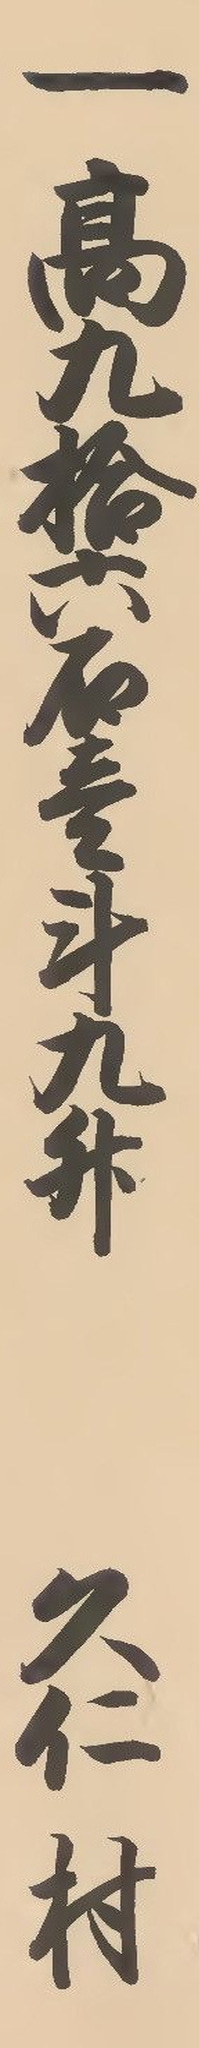一髙九拾六石壱斗九升久仁村
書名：上野国郷帳
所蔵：国立公文書館 National Archives of Japan
